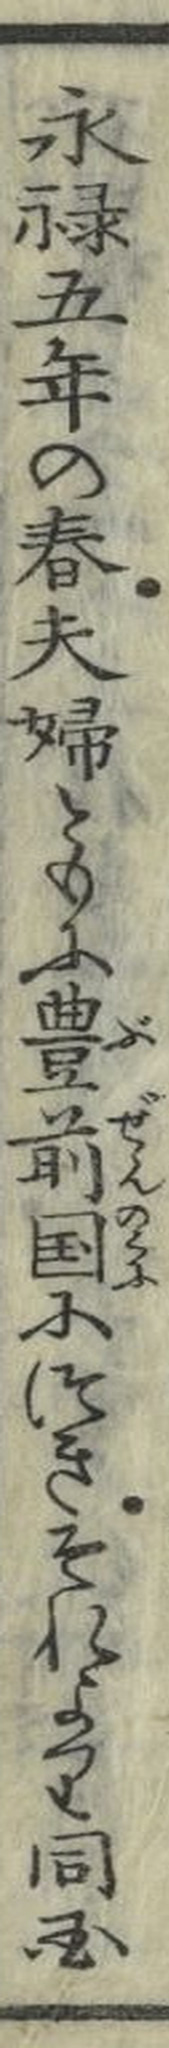永禄五年の春・夫婦ともに豊前国につき・それより同国

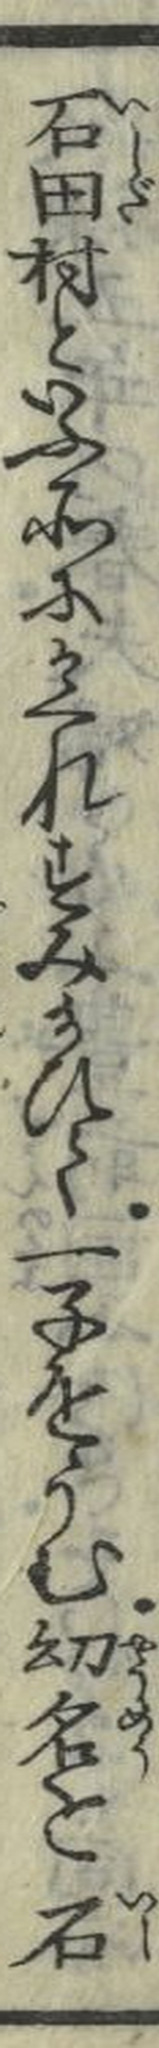石田村といふ所にかくれすみ給ひて・一子をうむ・幼名を石
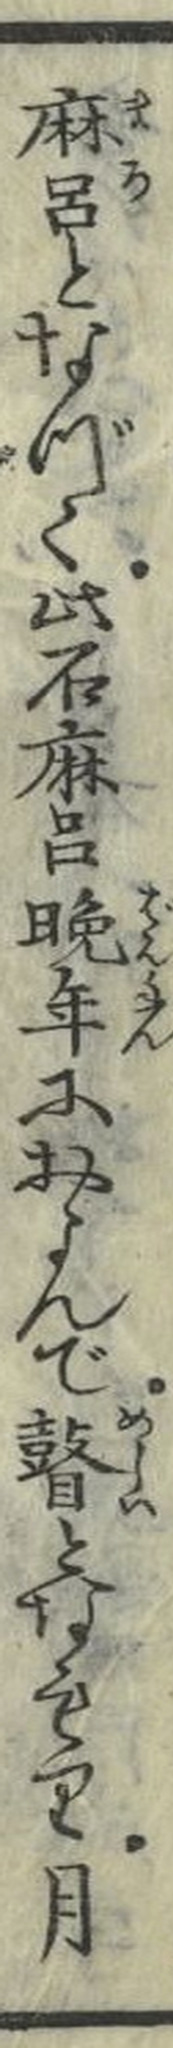麻呂となづく・此石麻呂晩年におよんで・瞽となれり・月
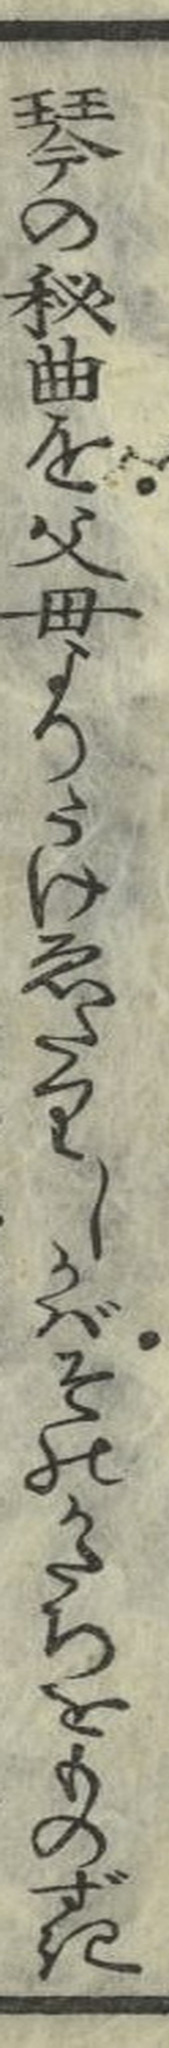琴の秘曲を・父母よりうけゑたりしかば・そのかたちをものずき
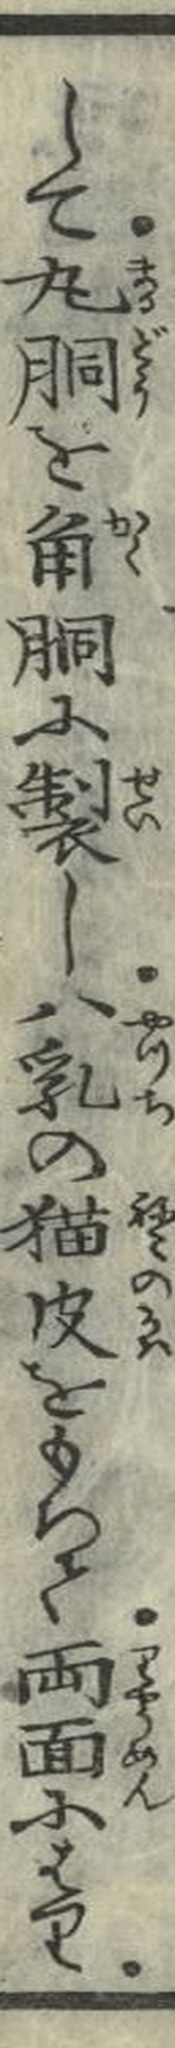して・丸胴を角胴に製し・八乳の描皮をもちて・両面にはり・
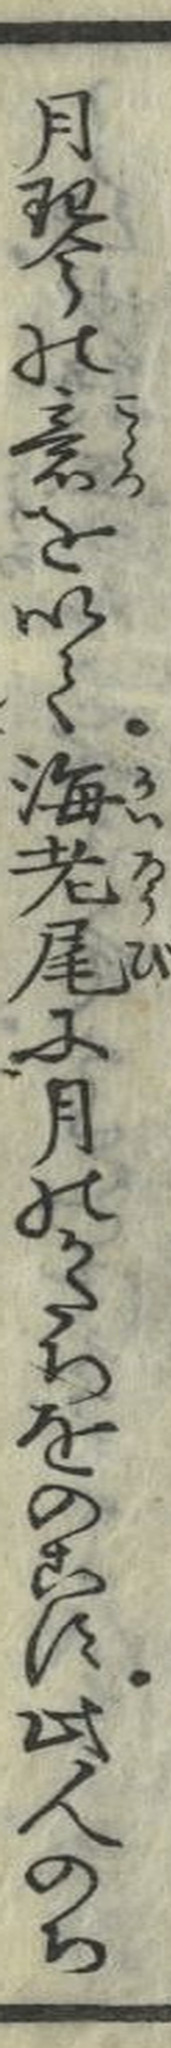月琴の意を以て・海老尾に月のかたちをのこす・此人のち
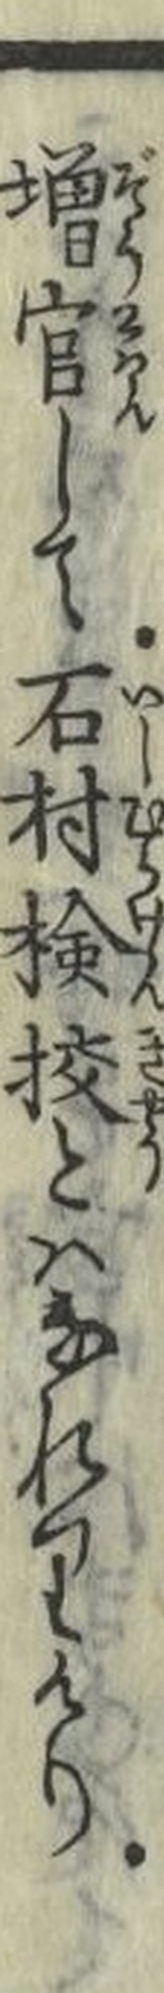増官して・石村検校とはなれりけり・
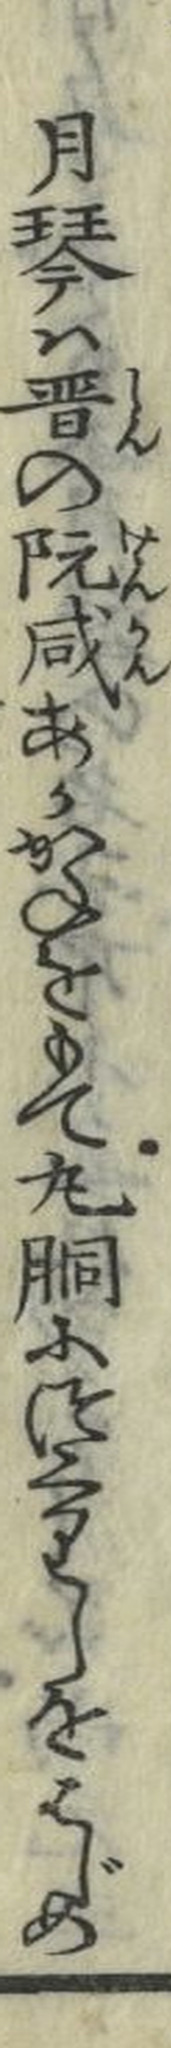月琴は晋の阮咸あかかねをもて・丸銅につくりしをはじめ
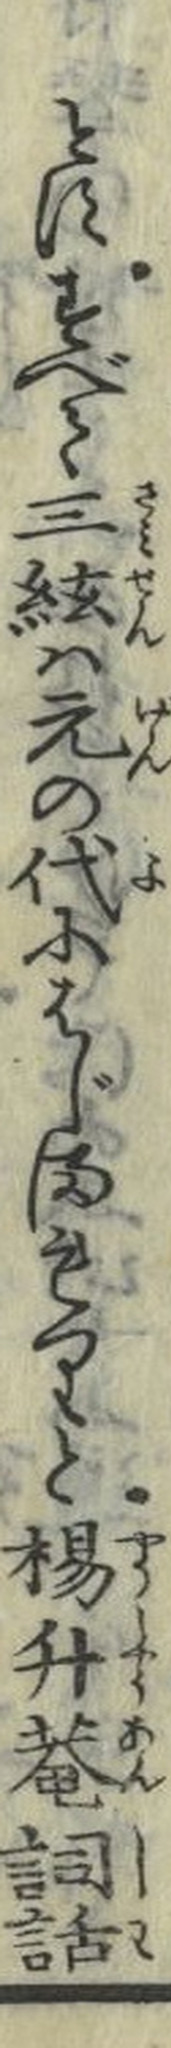とす・すべて三絃は元の代にはじまれりと・楊升菴詞話
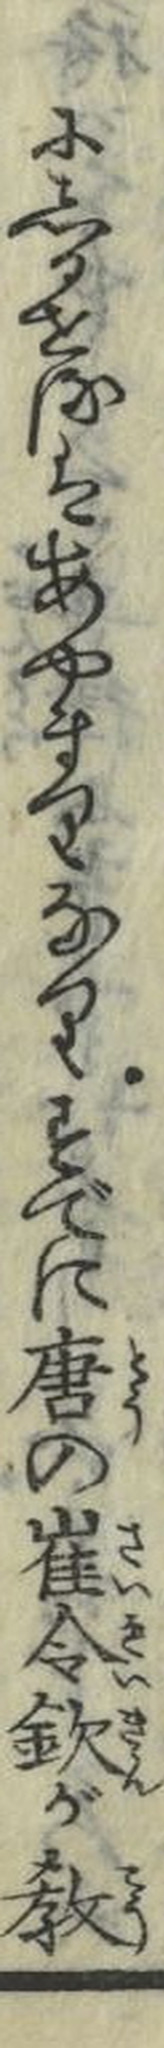にしるせるはあやまりなり・すでに唐の崔令欽が敎
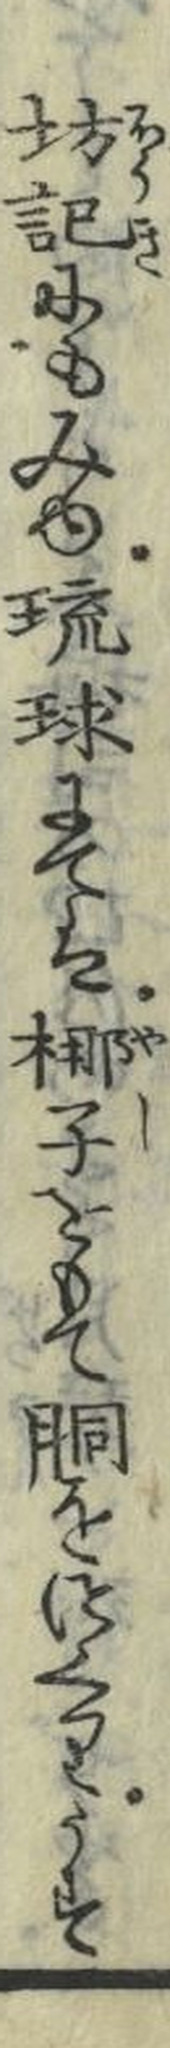坊記にもみゆ・琉球にては・椰子をもて胴をつくり・うす
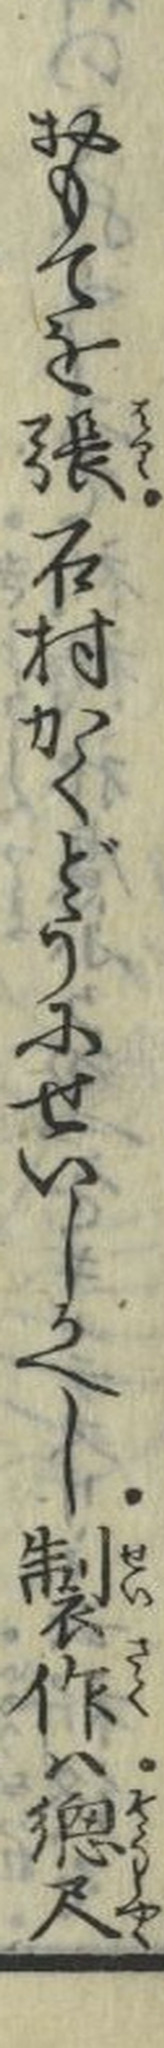おもてを張・石村かくどうにせいしかへし・製作は・總尺
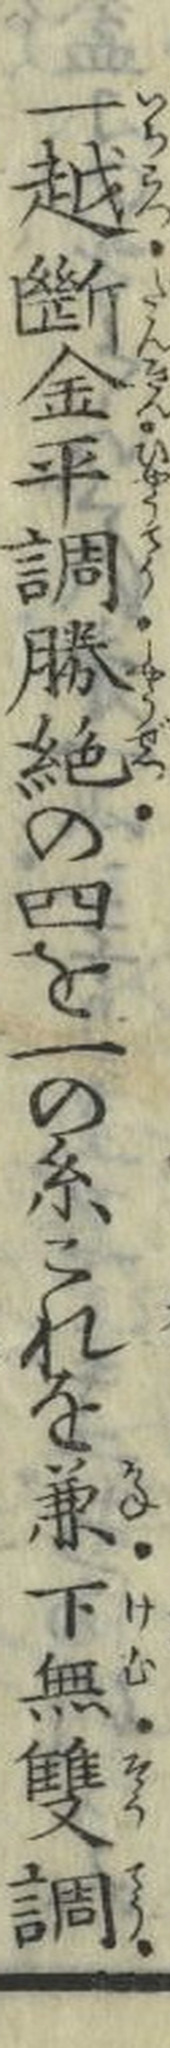一越・斷金・平調・勝絶・の四を一の糸これを兼・下無・雙調・
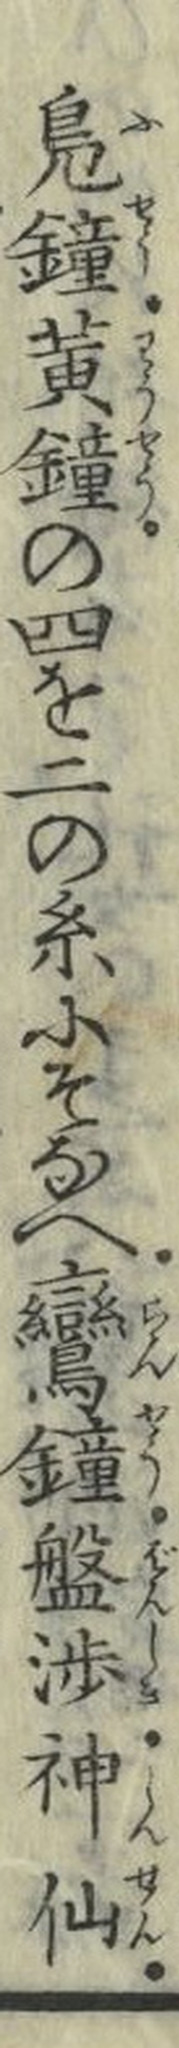鳬鐘・黄鐘・の四を二の糸にそなへ・鸞鐘・盤渉・神仙・
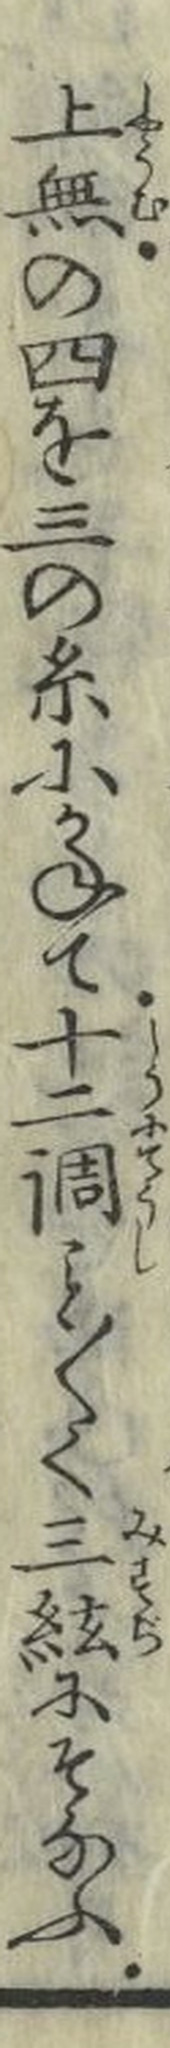上無・の四を三の糸にかねて・十二調こと〳〵く三絃にそなふ・
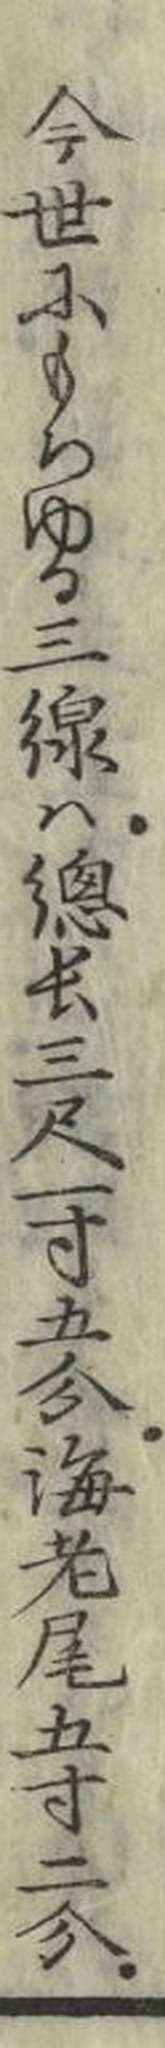今世にもちゆる三線は・總長三尺一寸五分・海老尾五寸二分・
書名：琉球秊代記 附雑話 全
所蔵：University of the Ryukyus Library
